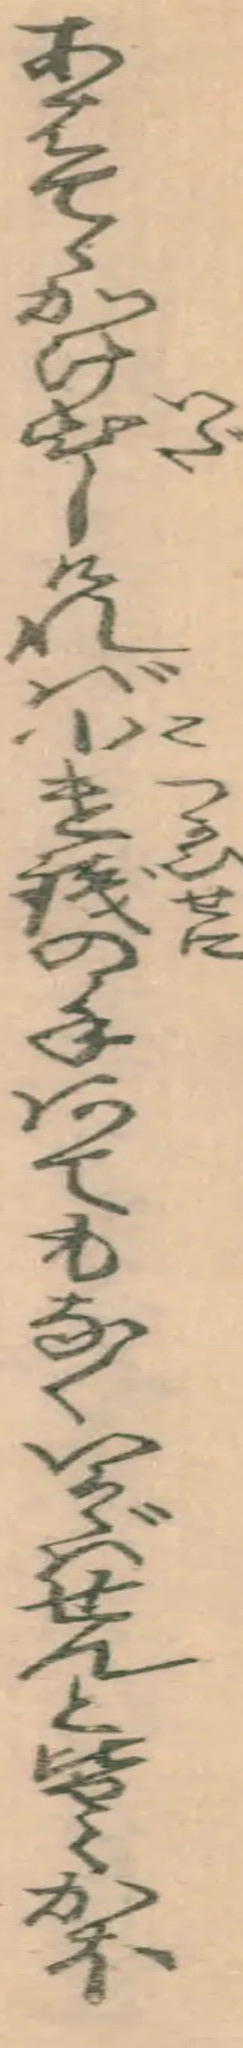あはてゝかけ出しければ小遣銭の手あてもなくいかゞはせんと皆々かほ
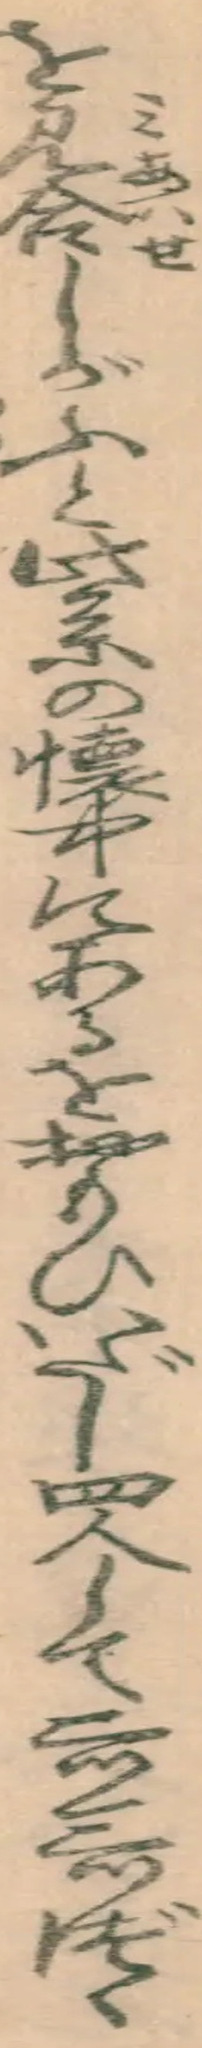を見合しがふと此薬の懐中にあるをおもひいだし四人して二ッ三ッづゝ
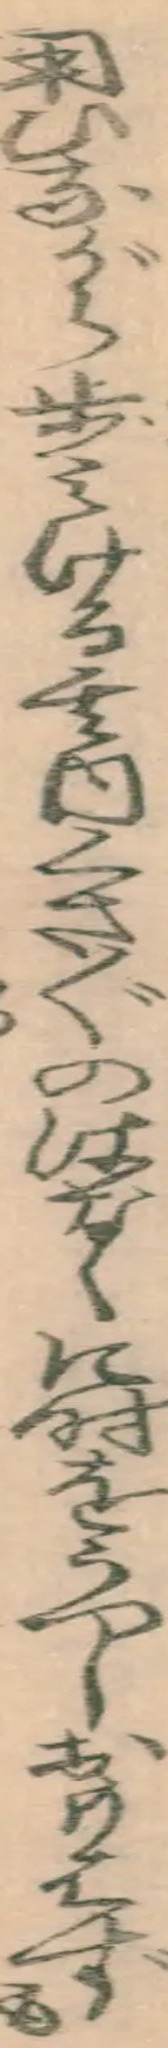用ひながら歩みける其内くさ〴〵のはなしに時をうつしおもはずも
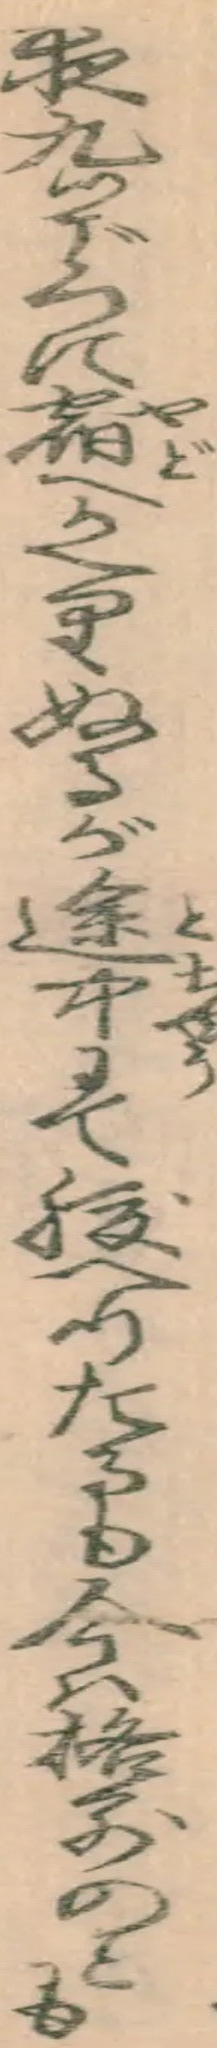夜九ッごろに宿へかへりぬるが途中にて腹へりたるも今は格別のことにも
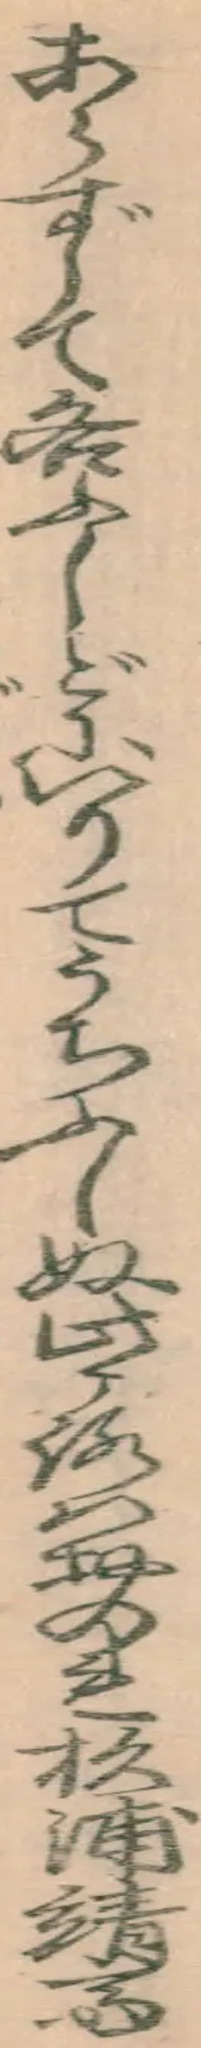あらずして各ふしどにいりてうちふしぬ此ころはおのれ杉浦請馬
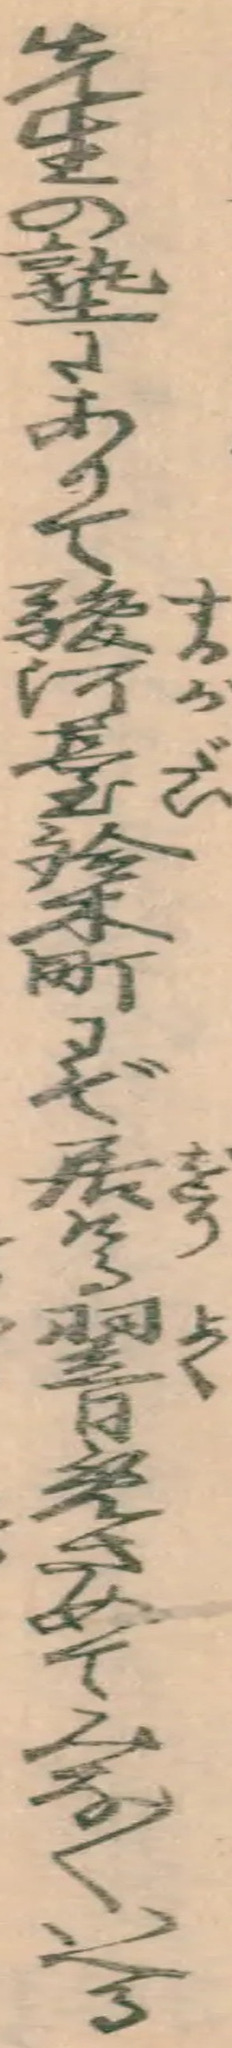先生の塾にありて駿河台鈴木町にぞ居ける翌日めさめてみな〳〵いへる
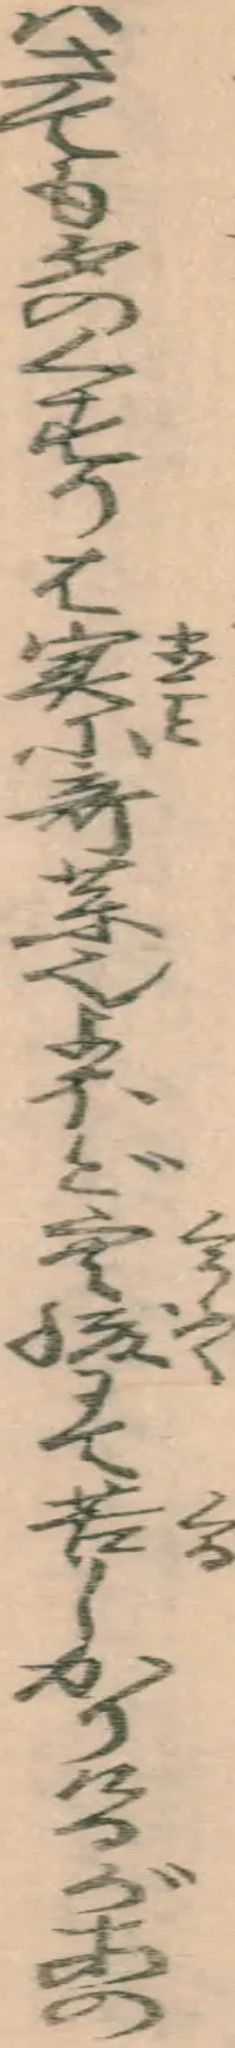はさても夕のくすりは実に奇薬也よほど空腹にて苦しかりけるがあの
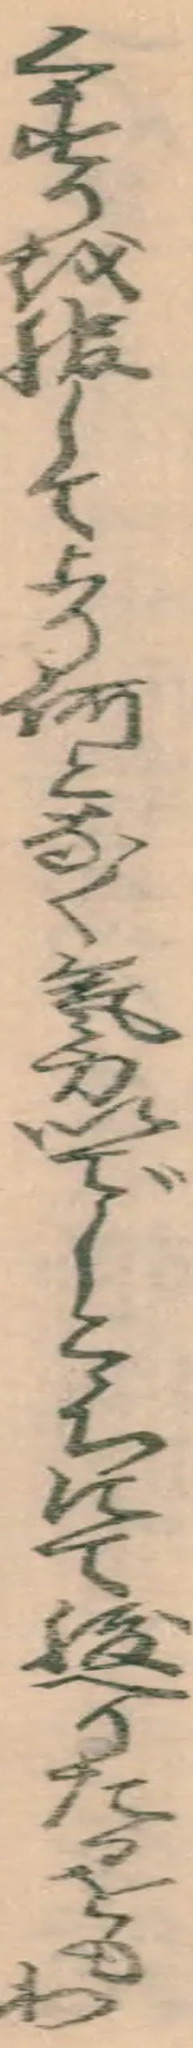くすりを服してより何となく気力いでしこゝちにて腹へりたるをもわ
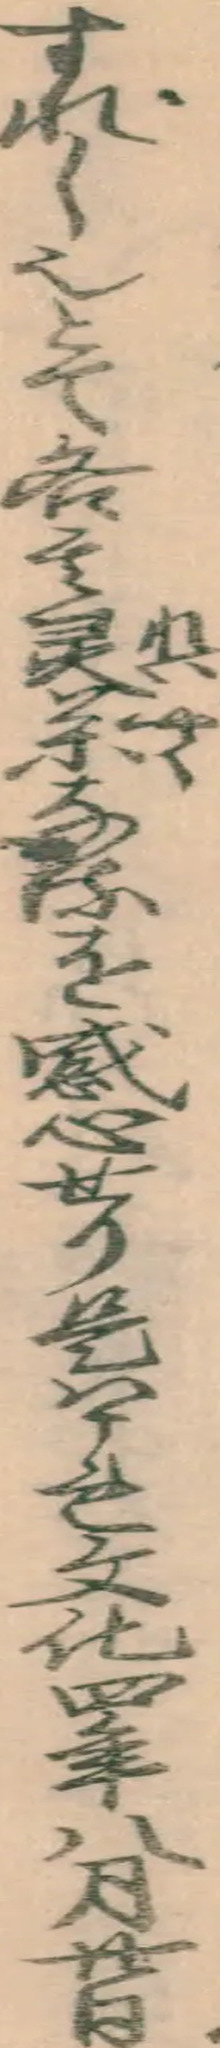すれし也とて各其霊薬なるを感心せり是はこれ文化四年八月廿日
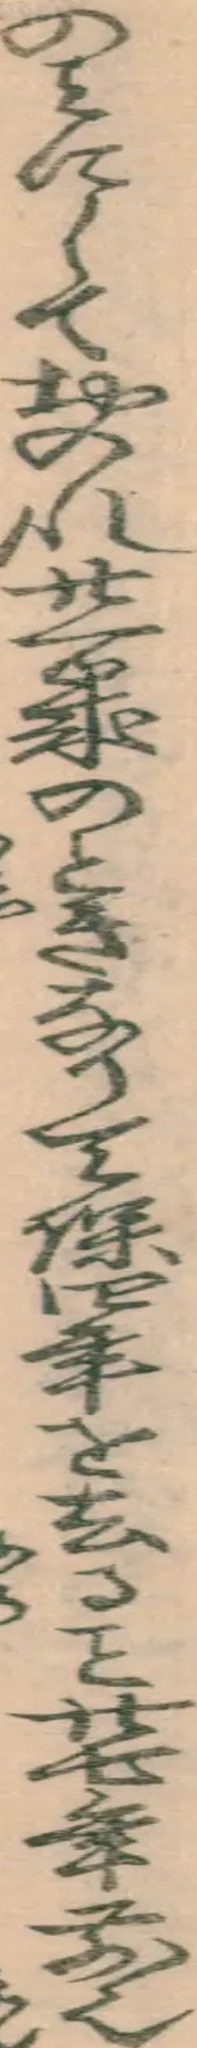のことにしておのれ廿一歳のときなり天保四年を去ること廿七年前也
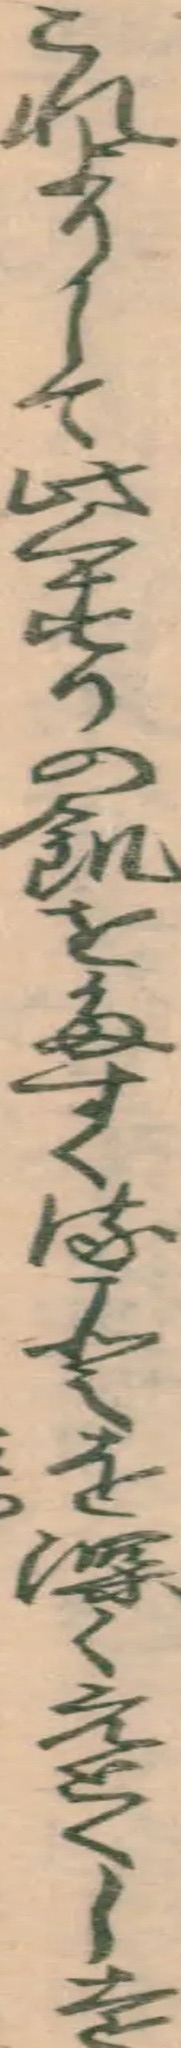これよりして此くすりの飢をたすくることを深くえとくし遠
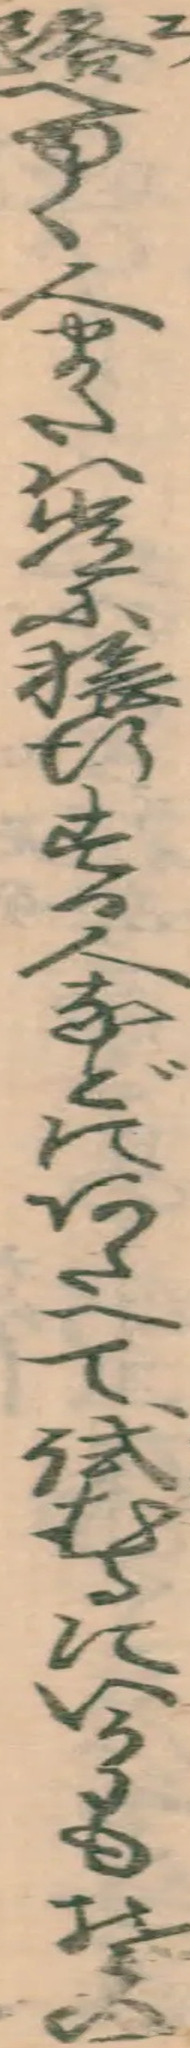路へゆく人または常に旅行する人などにあたへて試むるにいかにもその
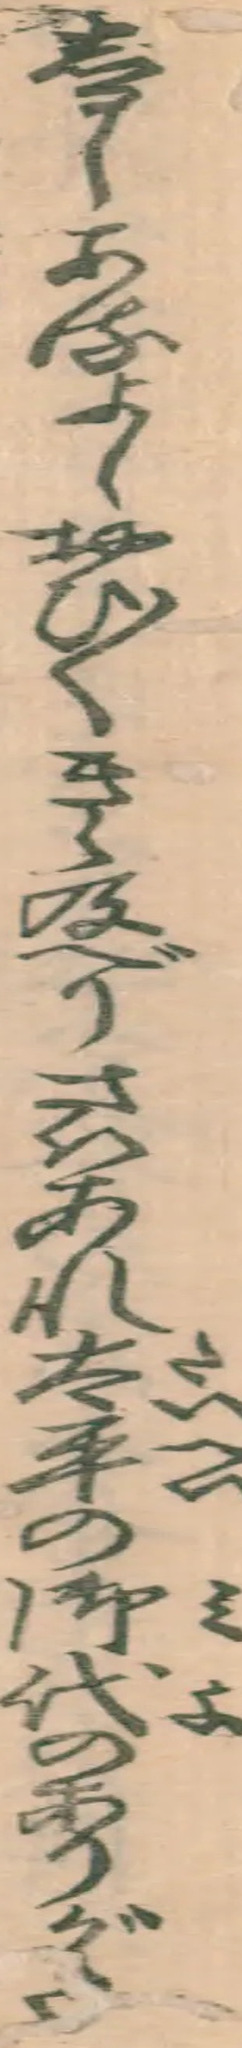しるしあるよしおひ〳〵きゝ及べりさはあれ太平の御代のありがた
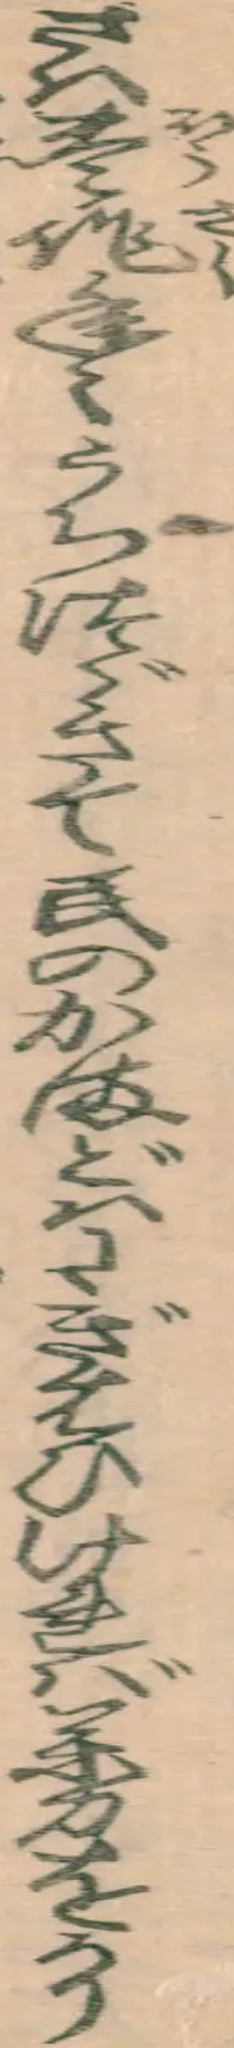さは豊作年々うちつゞきて民のかまどはにぎはひければ薬力をかり
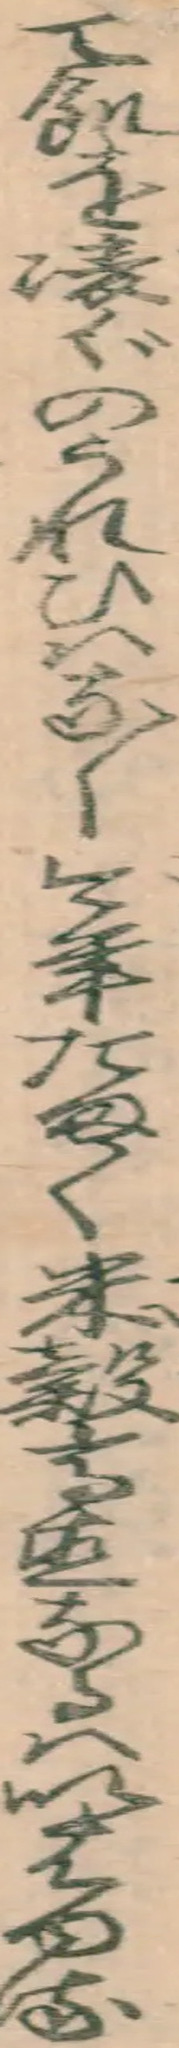て飢を凌ぐのうれひはなし今年たま〳〵米穀高直なるはいはゆる
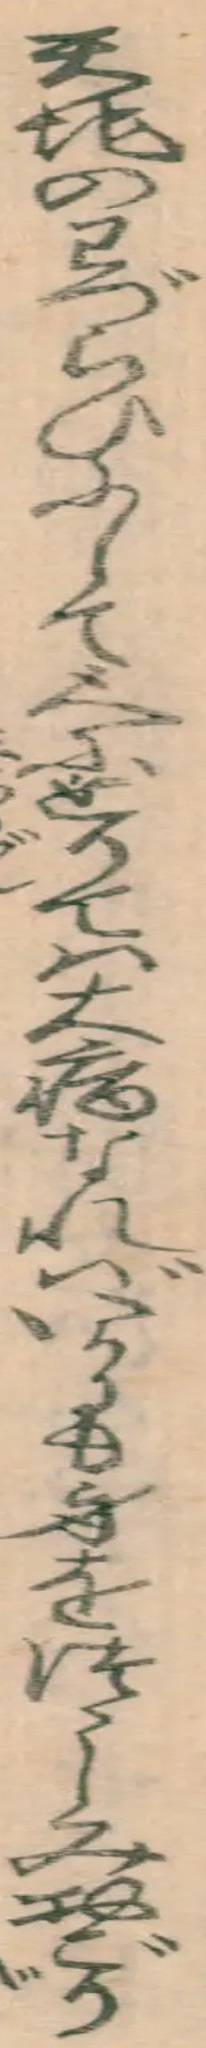天地のわづらひにして人にとりては大病なればいかにも身をつゝしみおごり
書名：日ごとの心得
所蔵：国立国会図書館 National Diet Library, JAPAN
